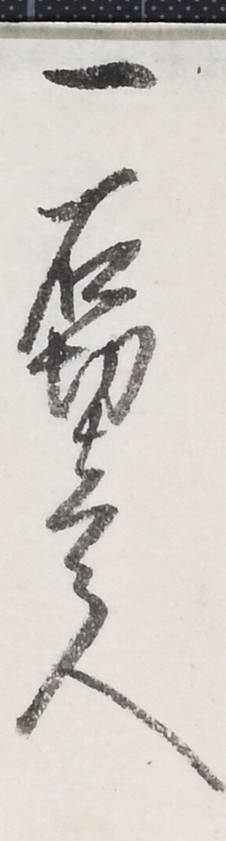一石切壱人
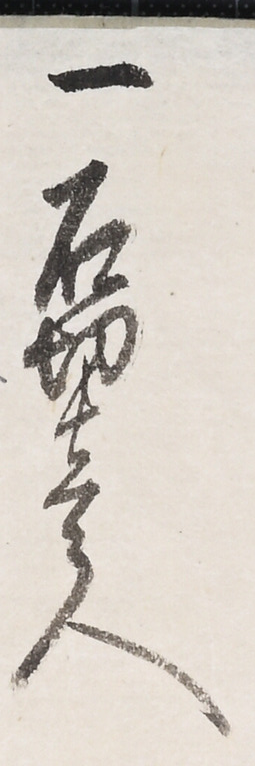一石切壱人
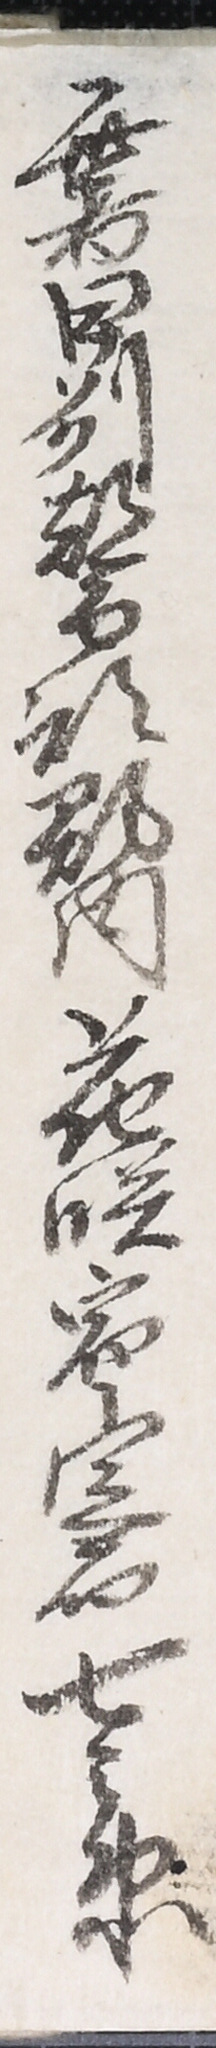此者甲州都留郡郡内下花咲宿定宿喜助
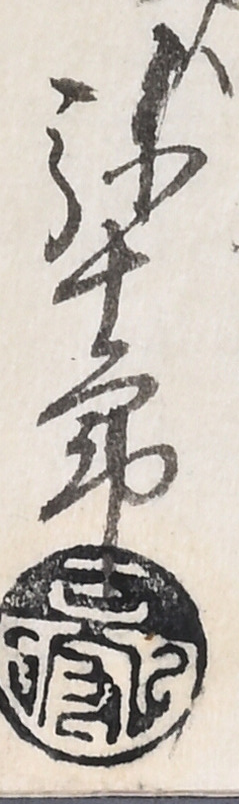弥三郎
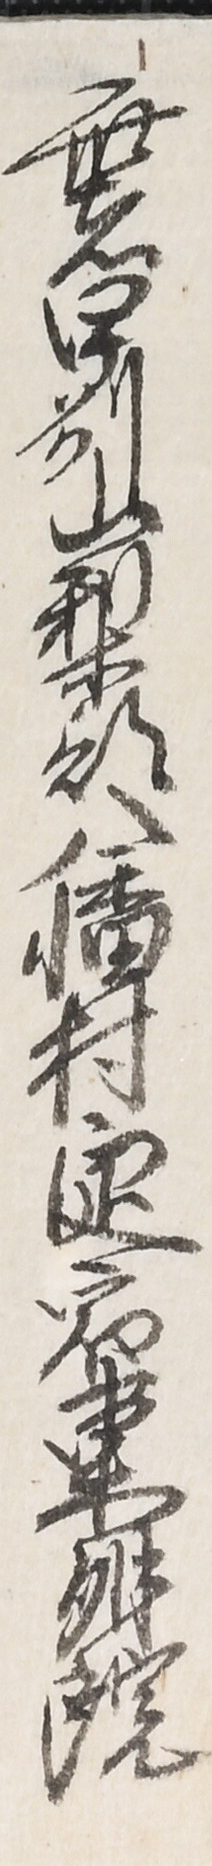此者甲州山梨郡八幡村定宿東明院
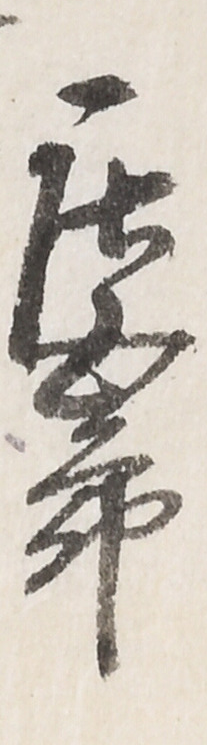庄五郎
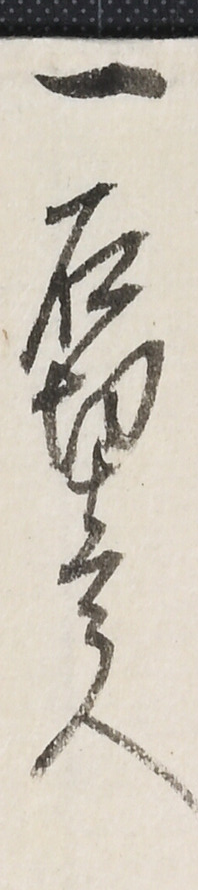一石切壱人
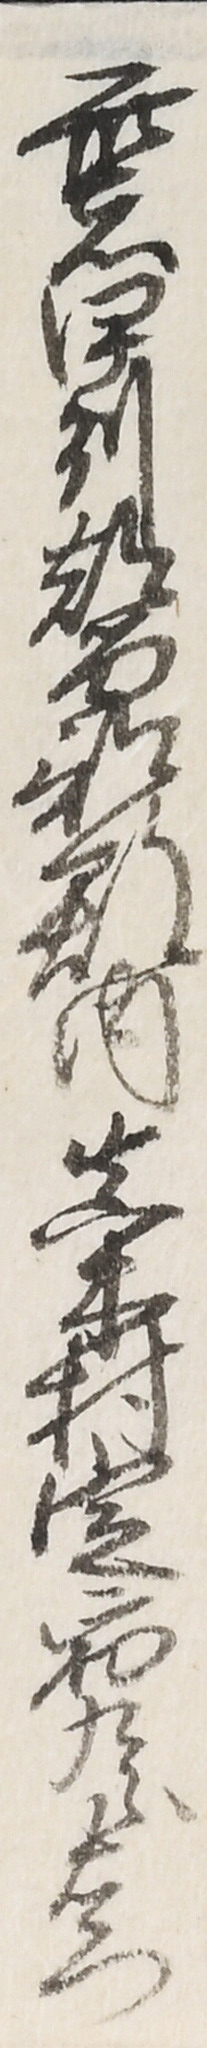此者甲州都留郡郡内真木村定宿九郎右衛門
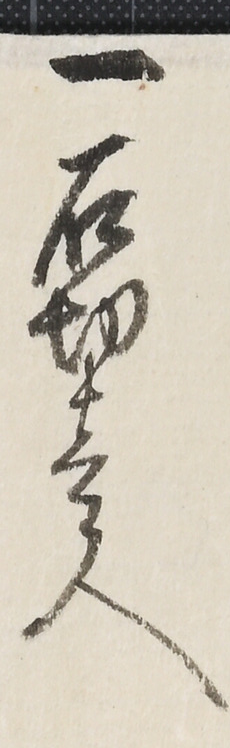一石切壱人
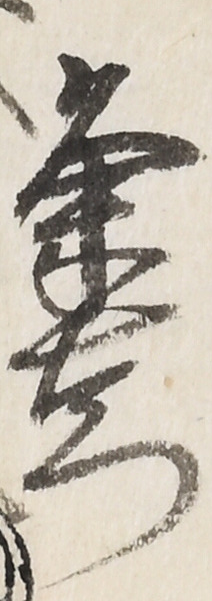粂右衛門
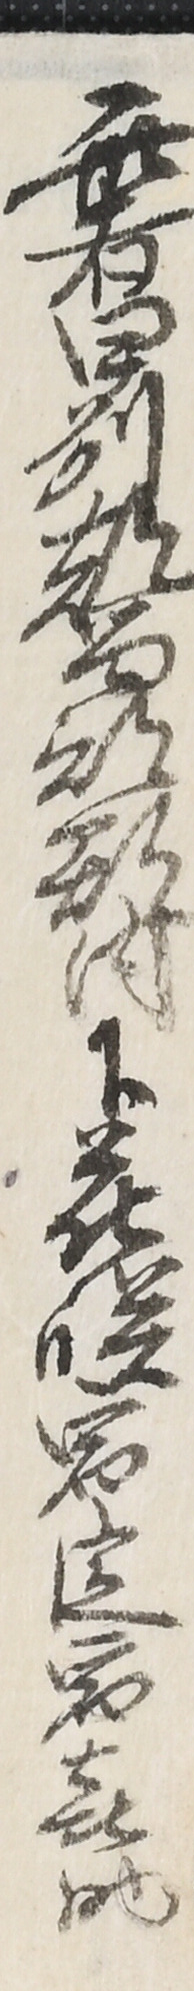此者甲州都留郡郡内下花咲宿定宿喜助
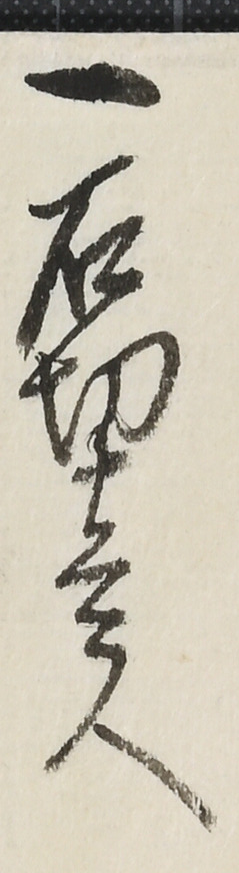一石切壱人
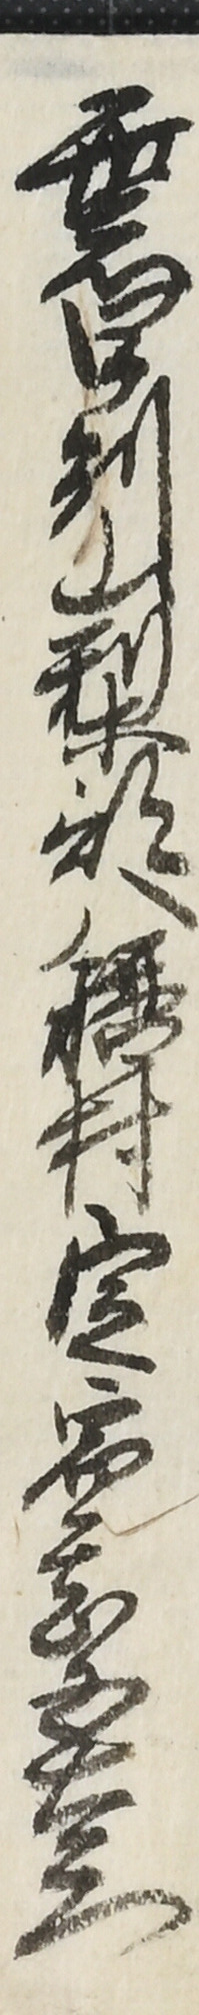此者甲州山梨郡八幡村定宿甚五右衛門
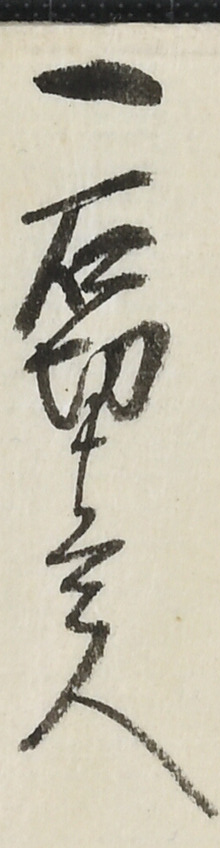一石切壱人

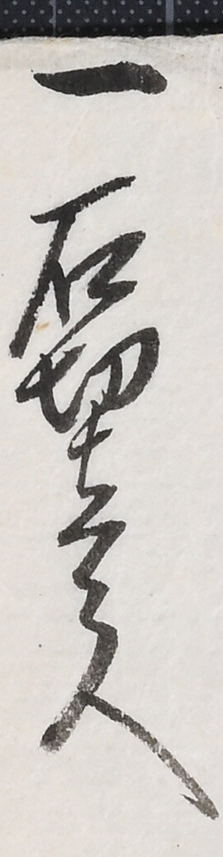一石切壱人
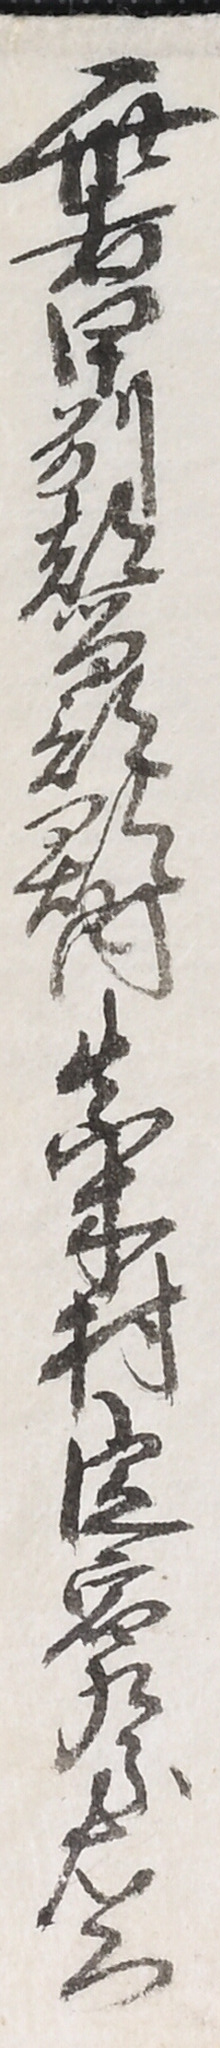此者甲州都留郡郡内真木村定宿九郎右衛門
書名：安政六己未年二月石切名前書上帳
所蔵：伊那市立高遠町図書館・合同会社AMANE
